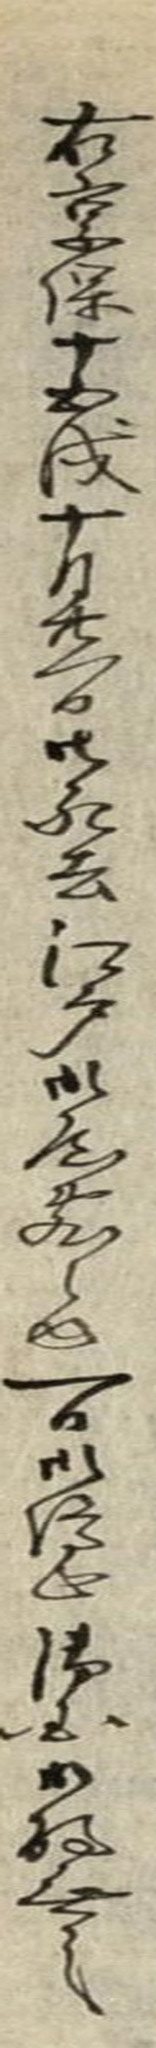右享保十五戌十月廿一日御死去江戸御屋敷之内一日御停止御国御触無之
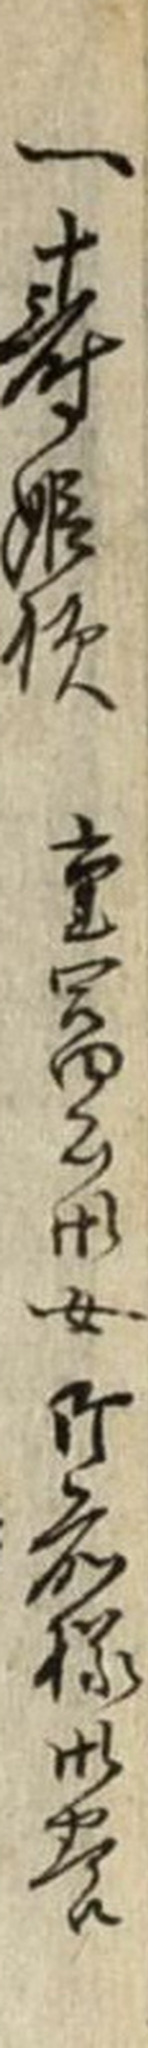一寿姫様重富公御女御前様御養
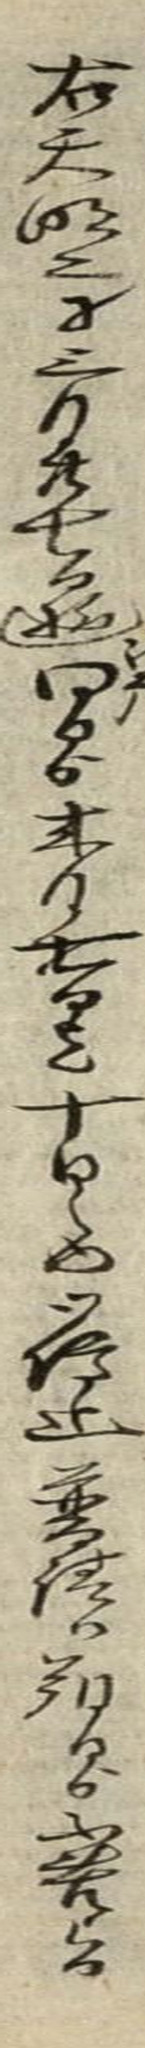右天明二刁三月廿七日逝・江戸同日より来月七日迄十日之内御停止普請は朔日ゟ不苦旨
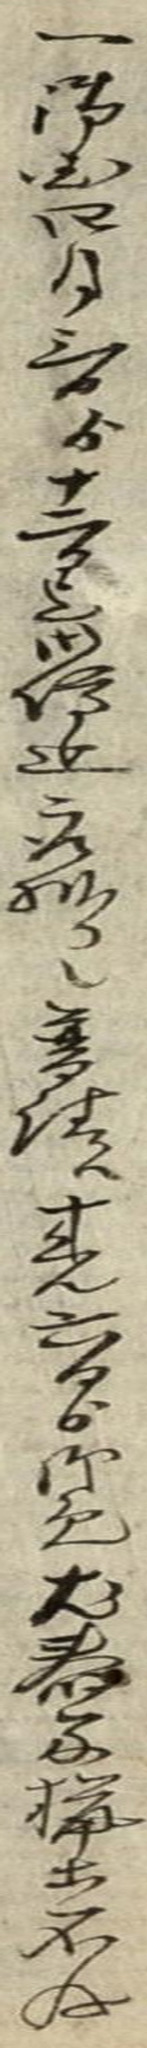一御国四月三日ゟ十二日迄御停止取掛り之普請は来ル六日ゟ御免尤舂米猟等不及
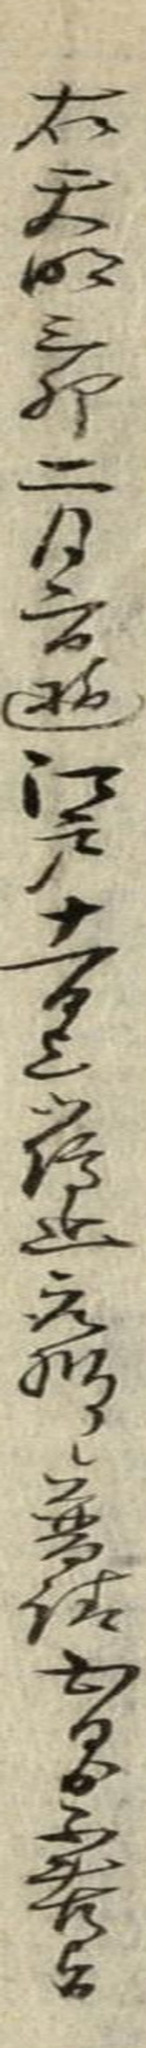右天明三卯二月二日逝江戸十一日迄御停止取掛り候普請五日ゟ不苦旨
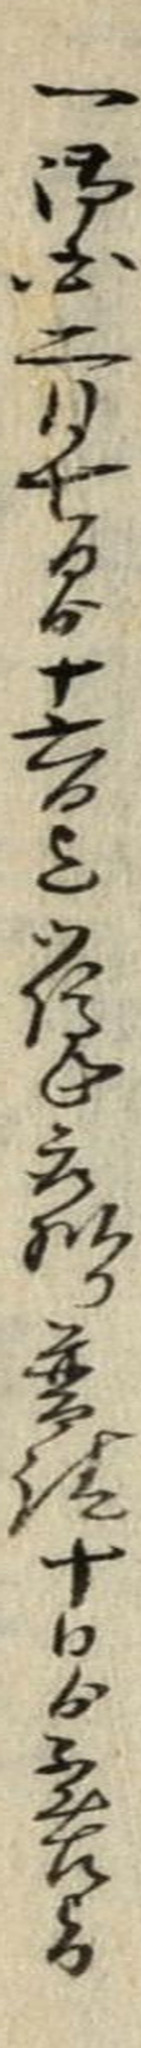一御国二月七日ゟ十六日迄御停止取掛り普請十日ゟ不苦旨
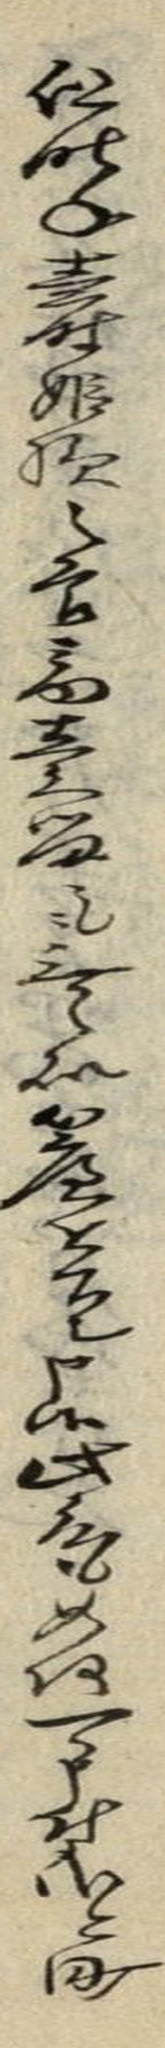但昨年寿姫様之節商売留にも無之処簾を下シ申候此度も如何可申付哉と町
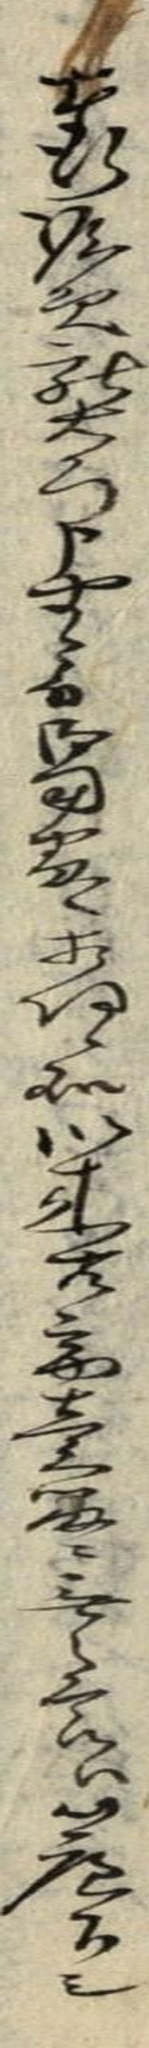奉行渥美新右衛門申聞候に付御用番へ相伺候処以来共商売留に無之節は簾下シ
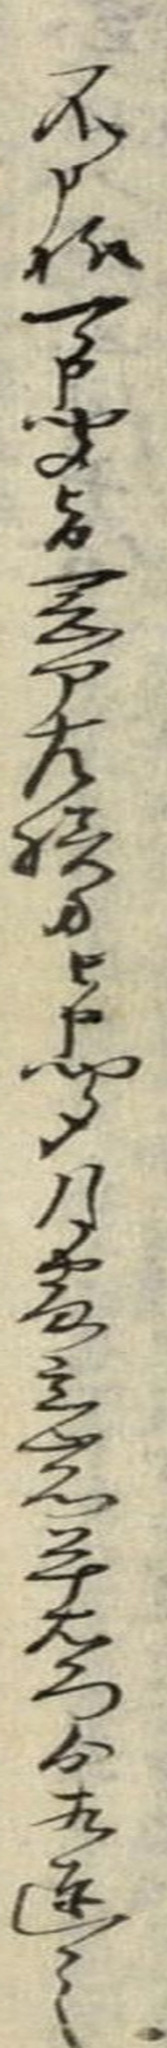不申様可申聞旨岡部左膳方被申聞月番立岩平右衛門ゟ相達之
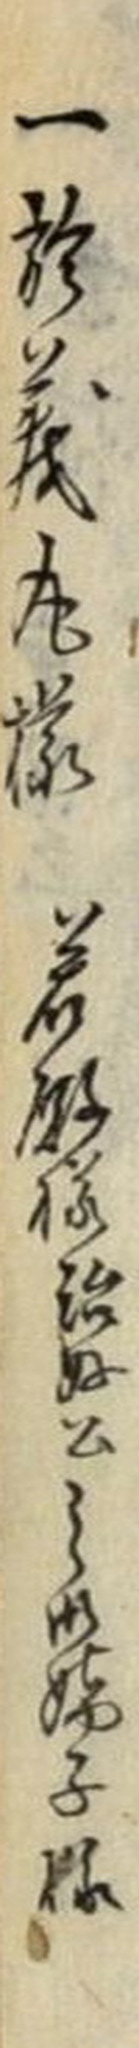一於義丸様若殿様治好公之御嫡子様
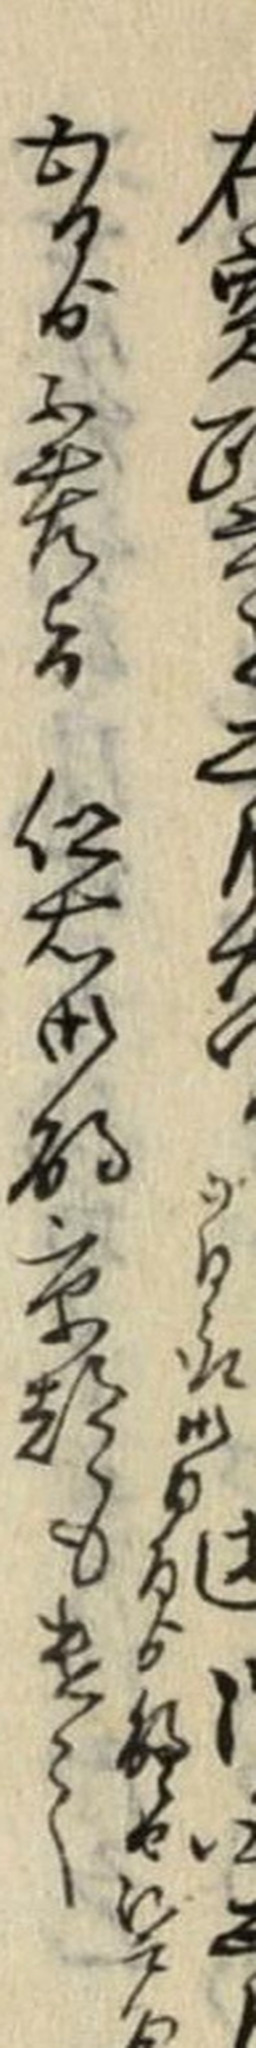五日ゟ不苦旨但右御触京都へも遣之
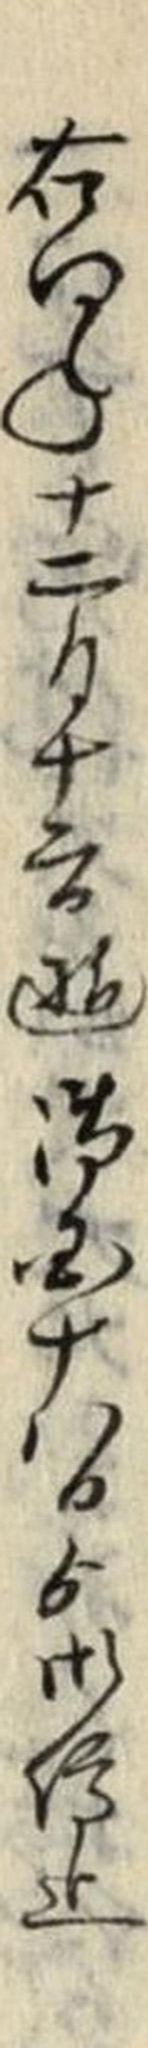右同年十二月十二日逝御国十八日ゟ御停止
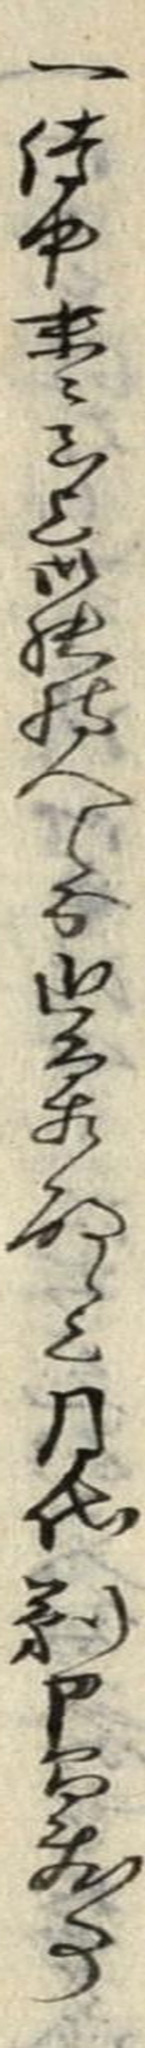一侍中末々至迄御扶持人之分追て相触候迄月代剃申間敷事
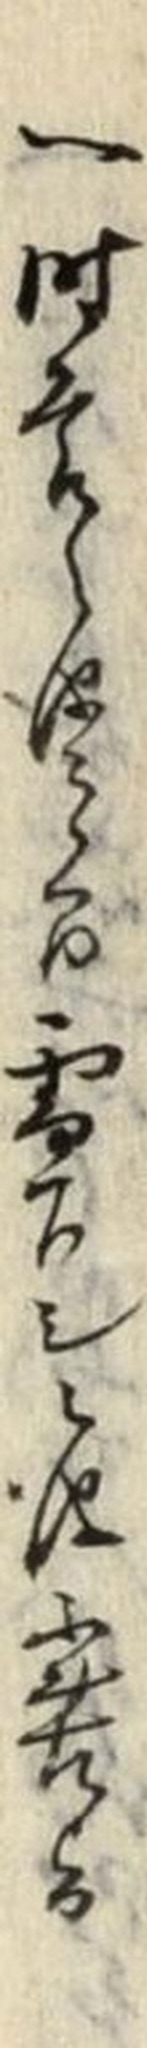一時節之儀に候間雪下シ之儀不苦旨
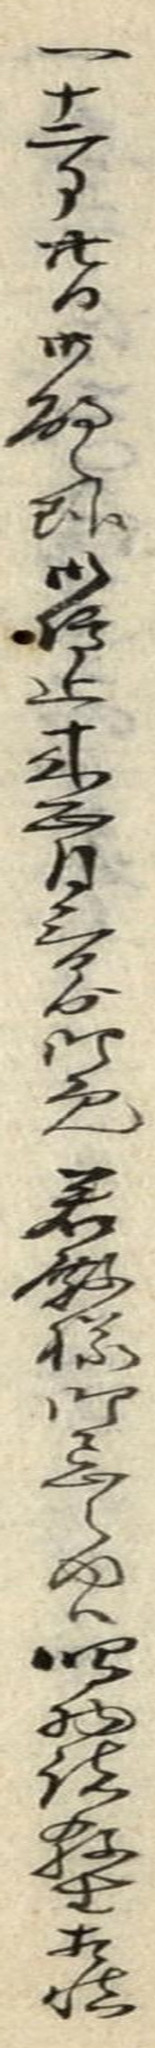一十二月廿日御触之趣御停止来正月三日ゟ御免若殿様御忌之内は鳴物諸殺生相慎
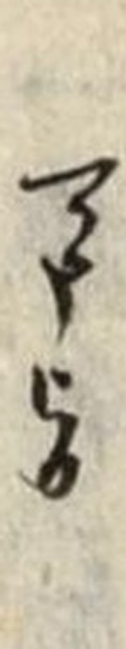可申旨
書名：御停止異変死失
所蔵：福井県文書館 Fukui Prefectural Archives
